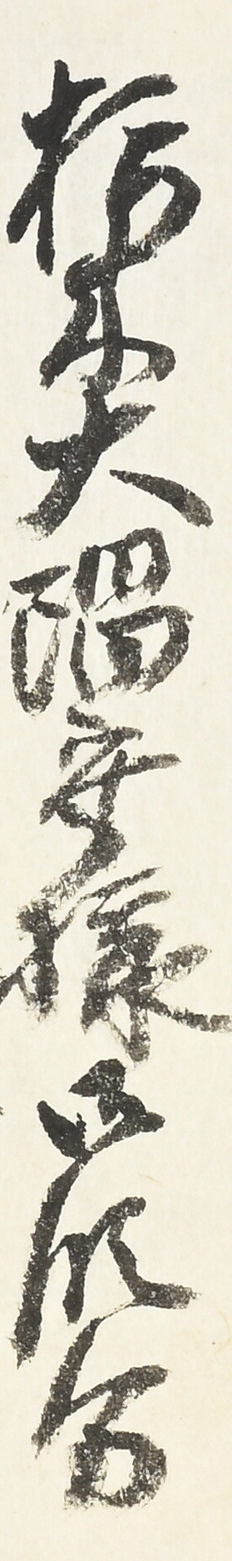朽木大隅守様御領分
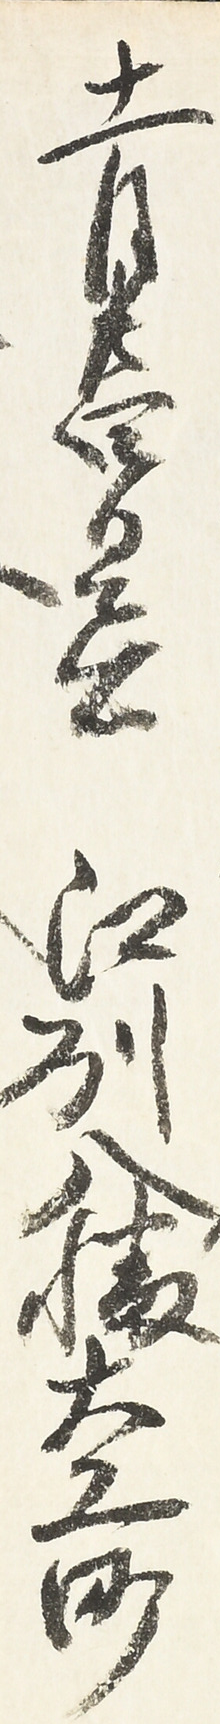十一月廿四日着江州八幡大工町
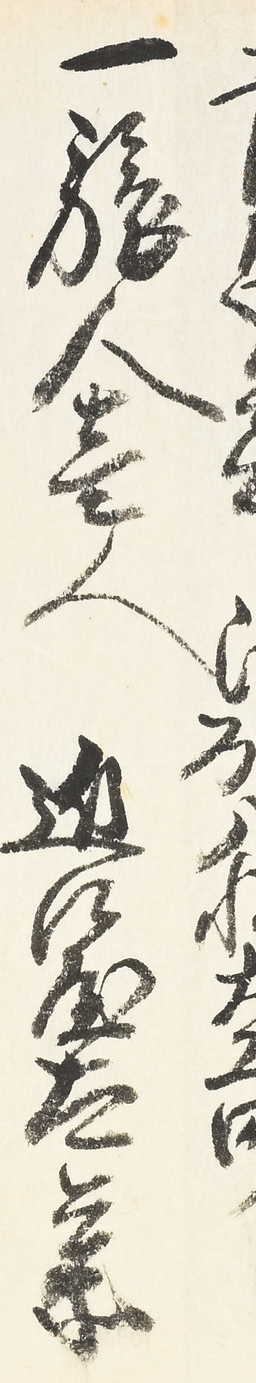一旅人壱人近江屋太兵衛
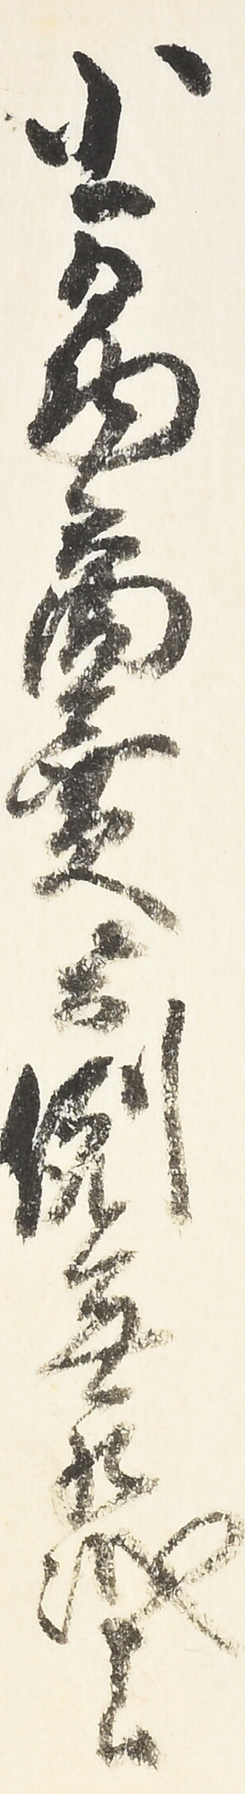小間物商売ニ而例年罷越申候
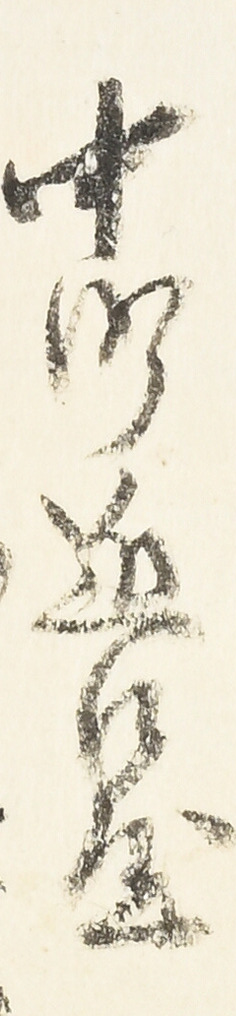中町近江屋
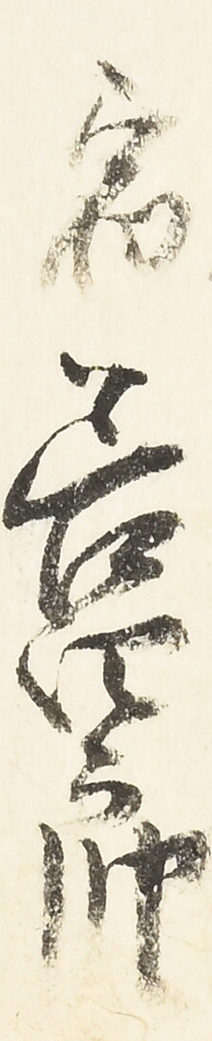宿善四郎
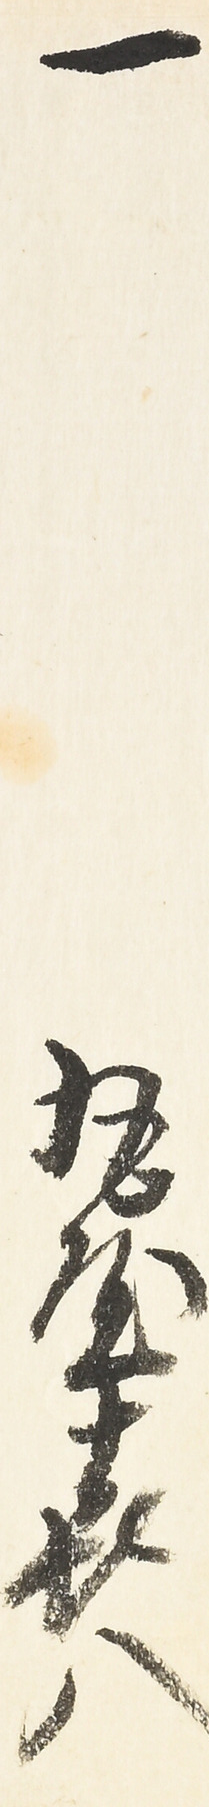一丸屋喜八
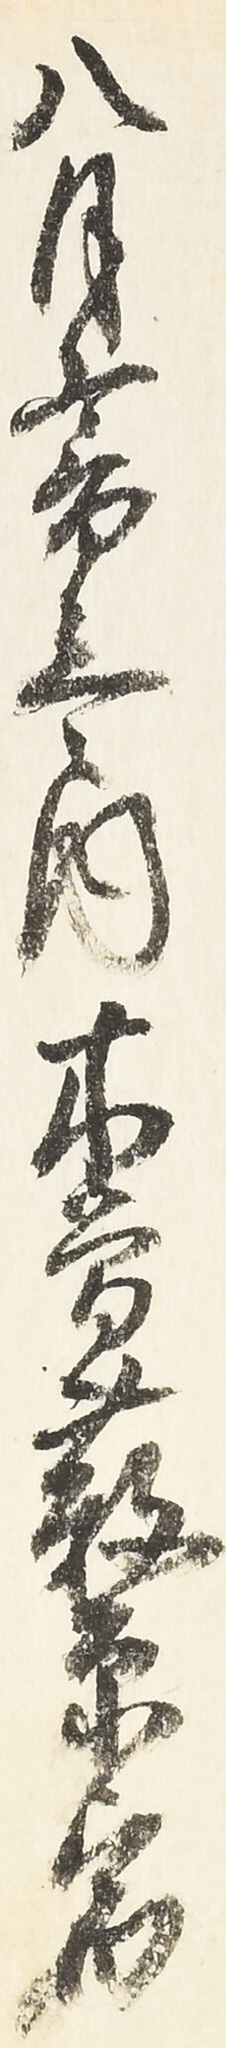八月書上之内木曽藪原宿
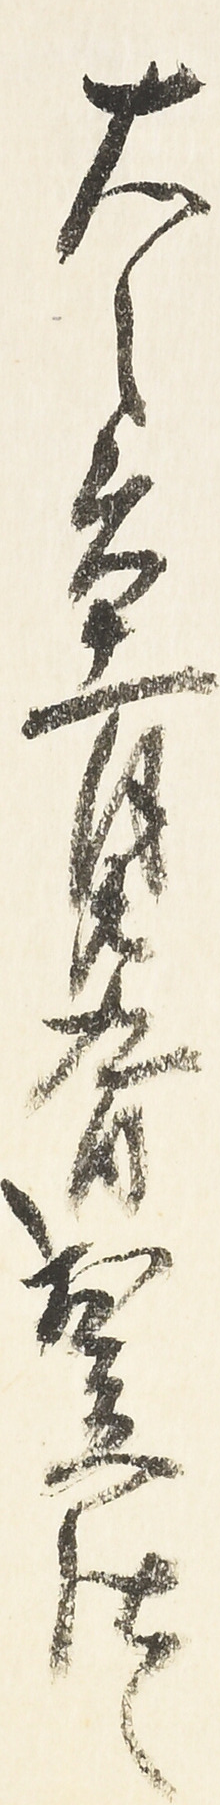右之者十一月廿九日出立仕候
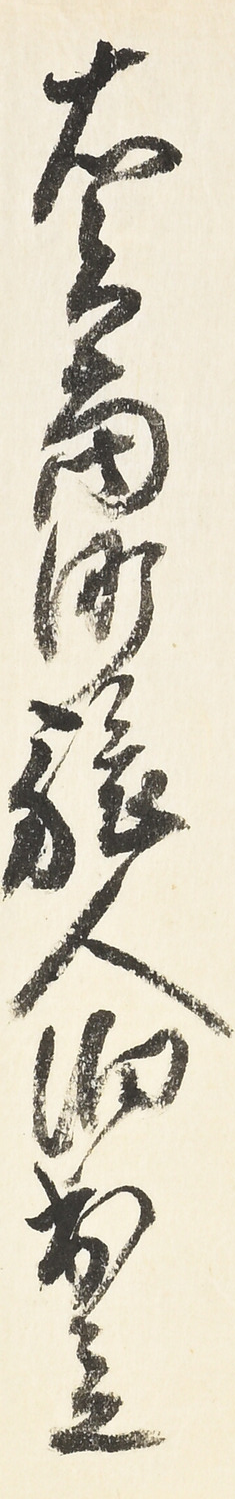右者当町旅人泊出立
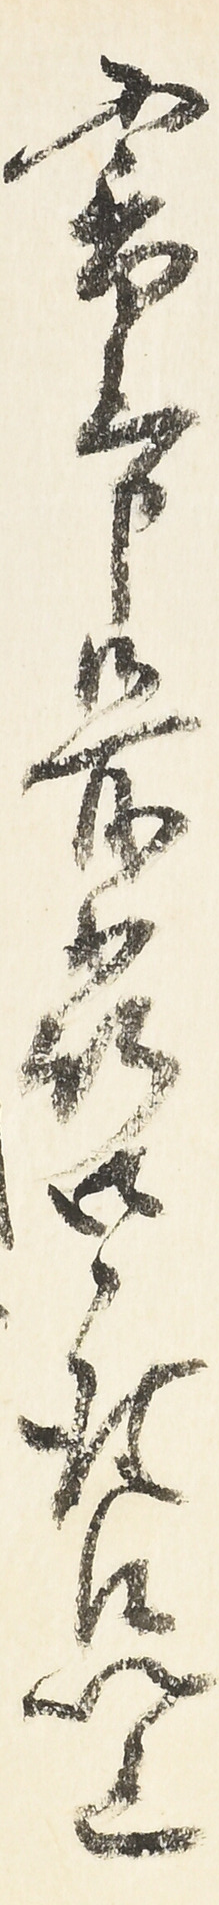書上申候所如斯御座候以上
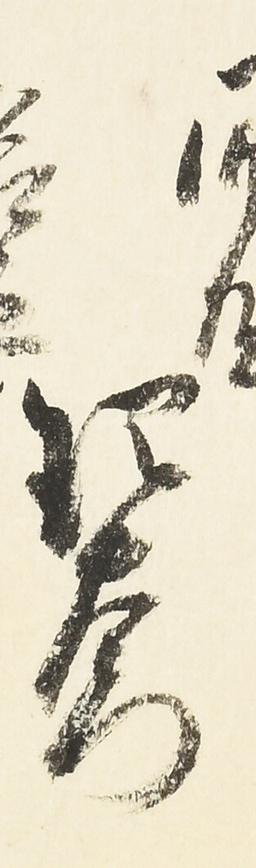平右衛門
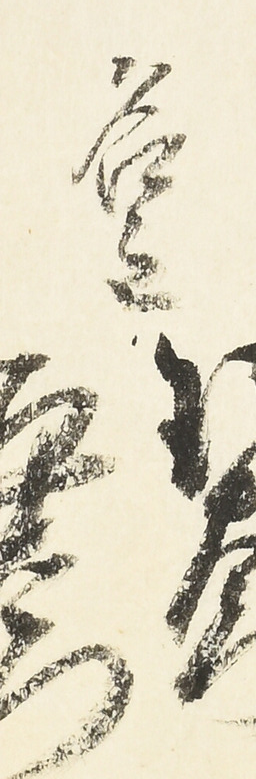酉理右衛門
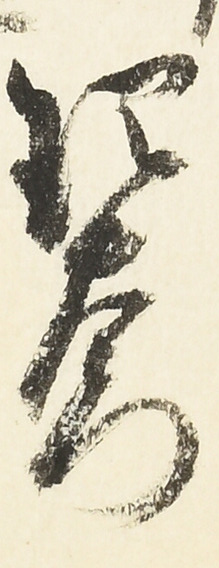酉理右衛門
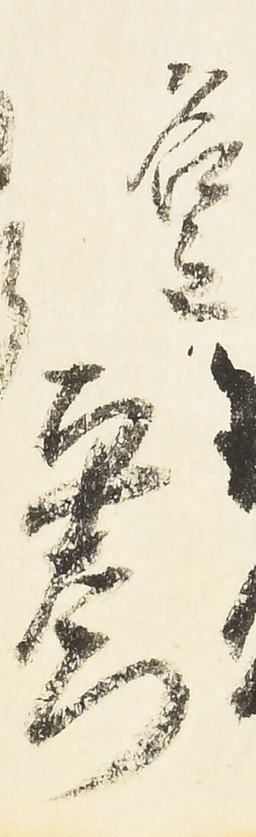平右衛門
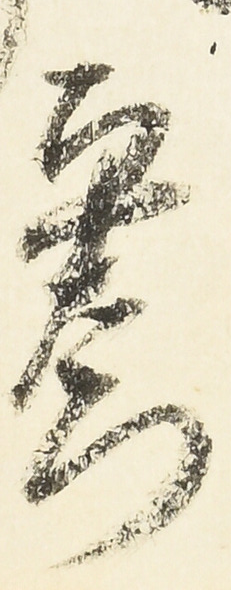酉理右衛門
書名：町中旅人泊控帳
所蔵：伊那市立高遠町図書館・合同会社AMANE
